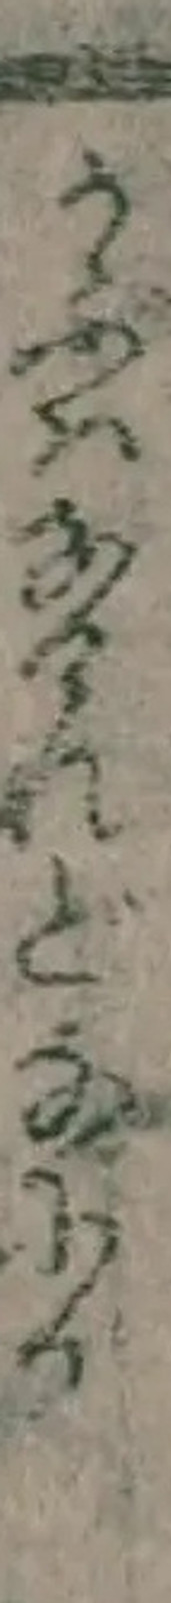かぶはなけれどなにか
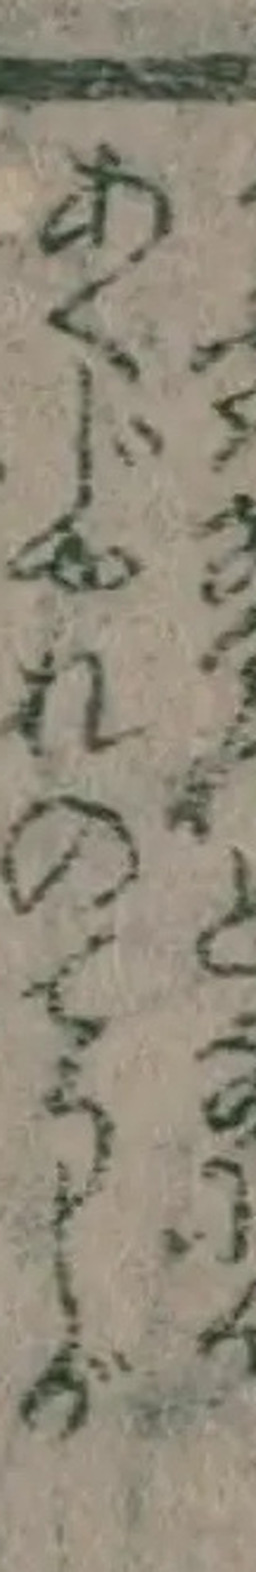あくじゃれのてうしが
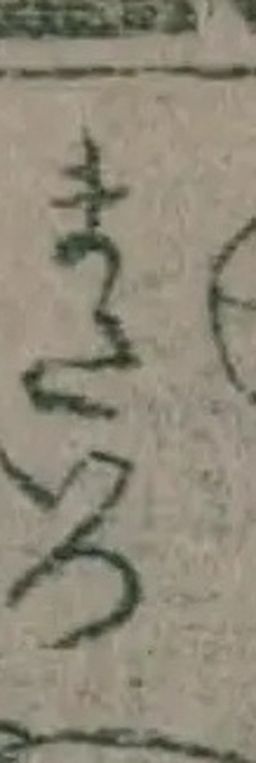またいつ
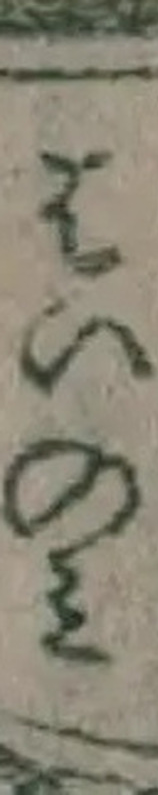はいのみ
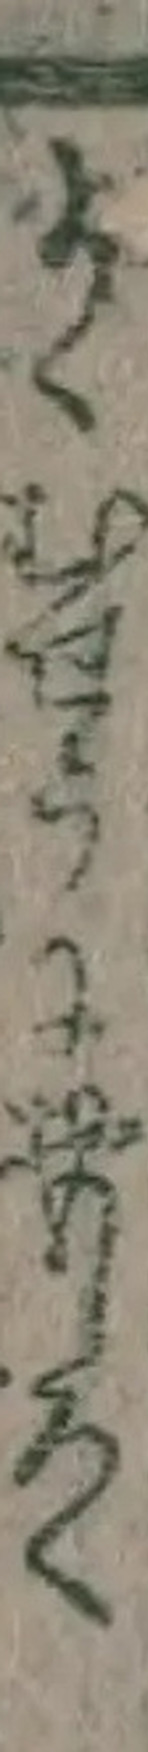よくむせうにおもしろく
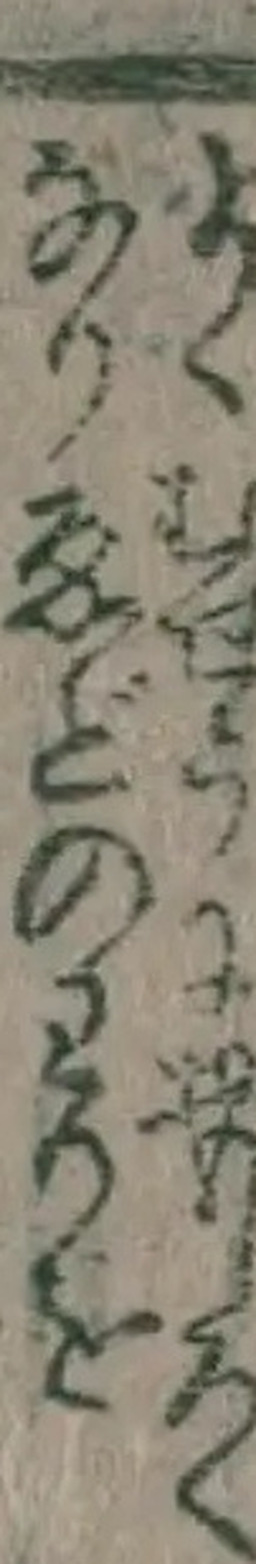なりゑどのわりを
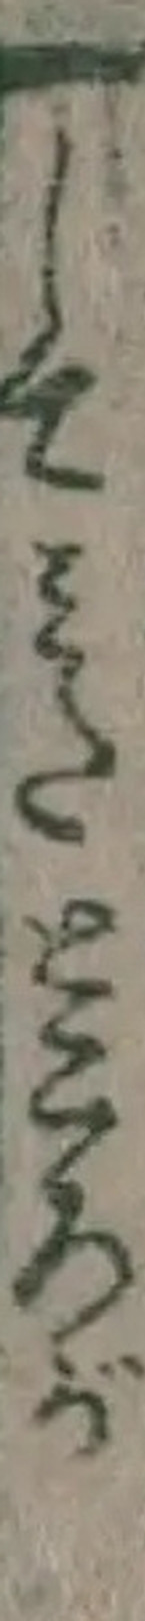してみたところが
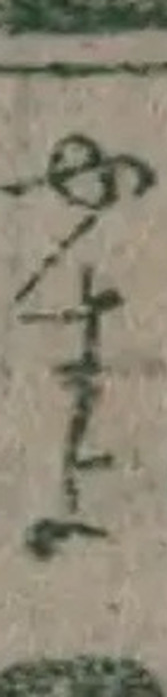やすよ
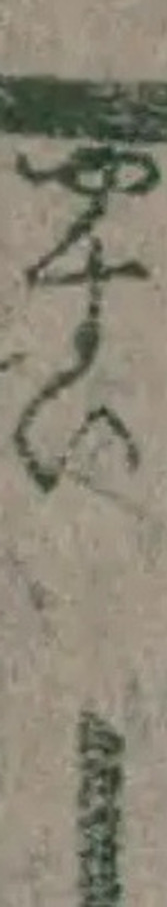やすい
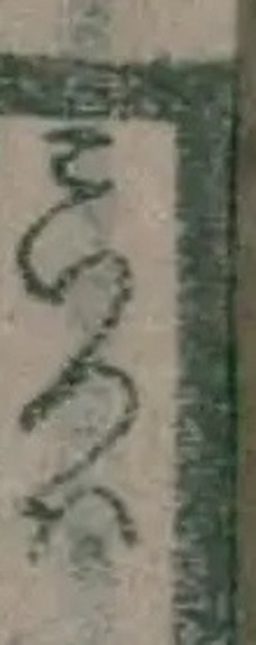こいつは
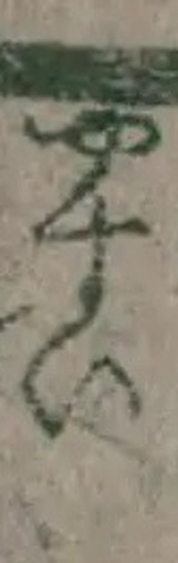やすい
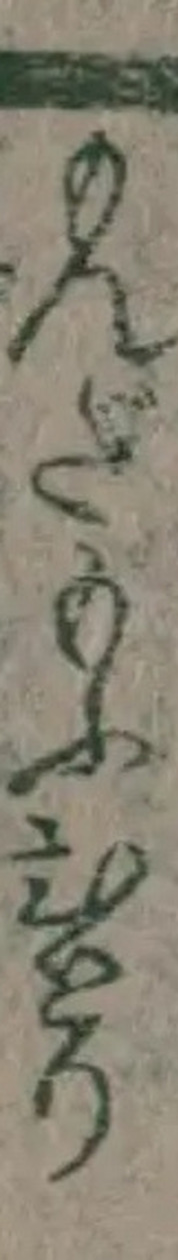もんだもふひとり
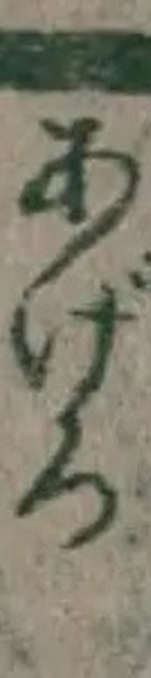あげろ
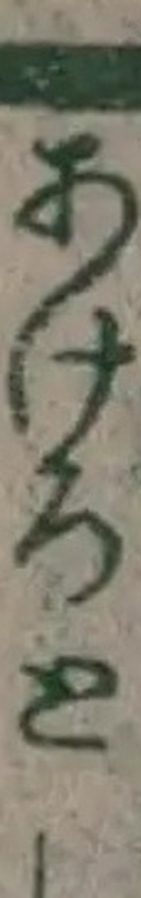あけろと
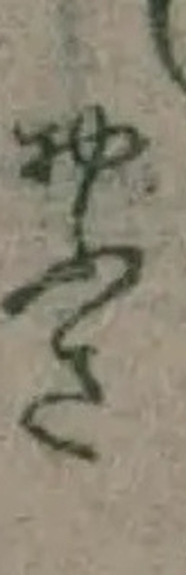おふさ
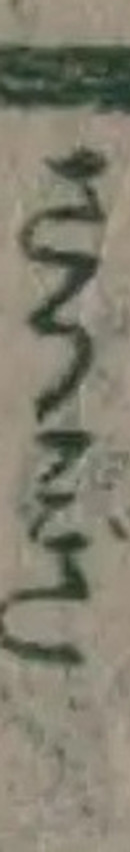さわぎ
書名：縦筒放唐の噺 3巻
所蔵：国立国会図書館 National Diet Library, JAPAN
